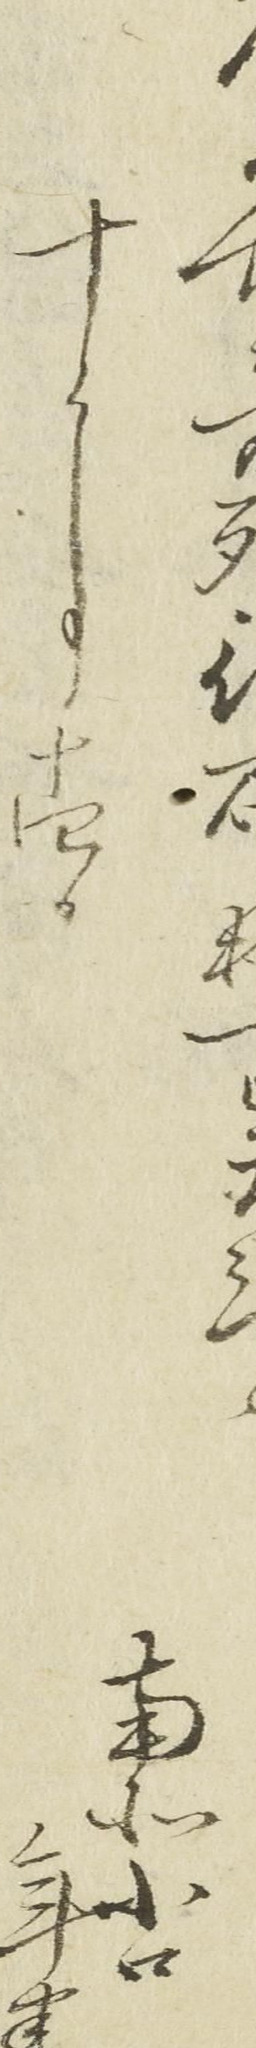十月十四日南北小口
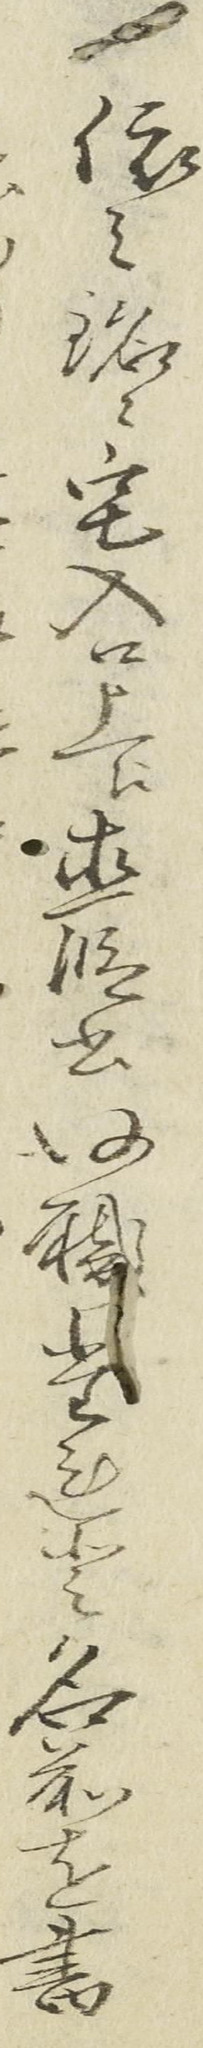依之銘々宅入口え直段書何職たれど名前を書
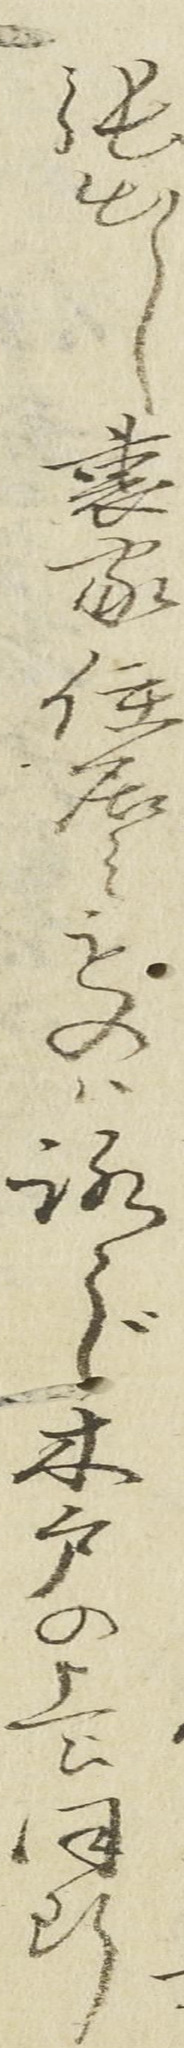張出し裏家住居之ものハろじ木戸の上え同断
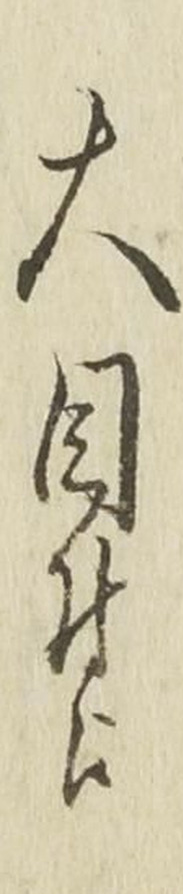大目付え
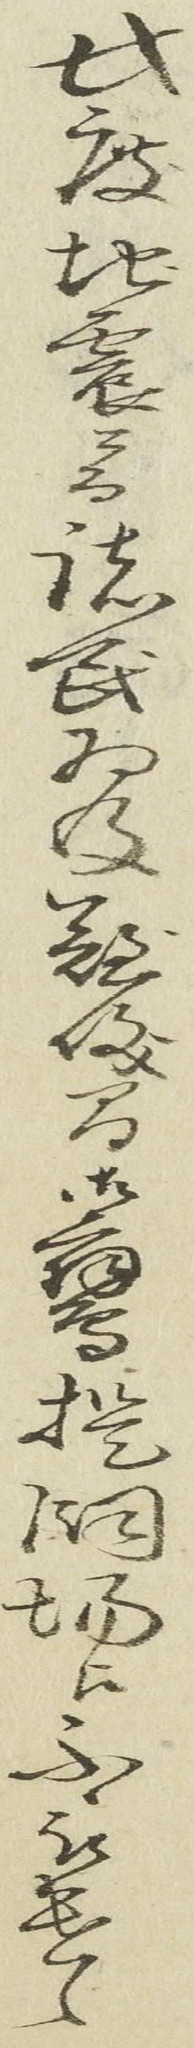此度地震に而諸民為及難儀間御鷹提飼場え不日被遣候
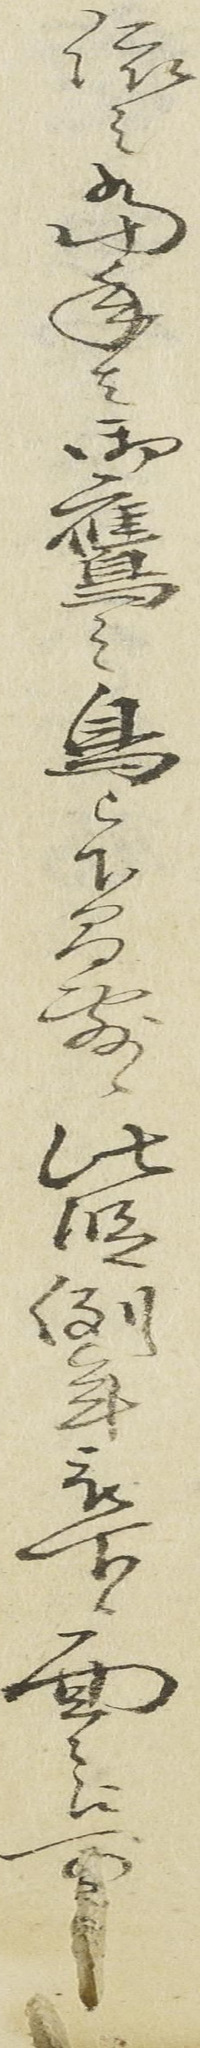依之当年は御鷹之鳥被下間敷候此段例年被下候面々え可申
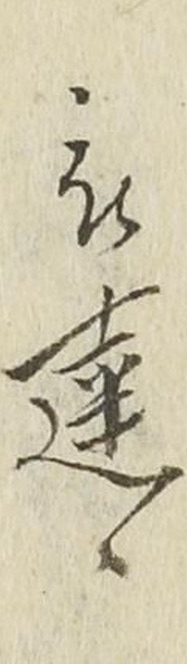被達候
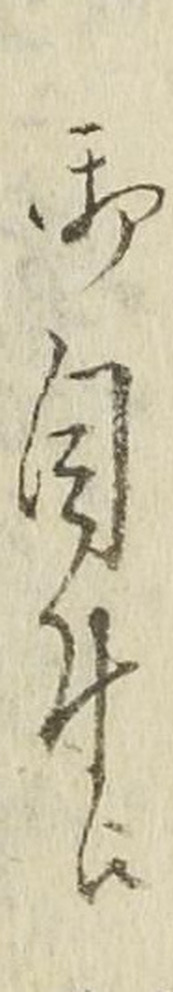大目付え
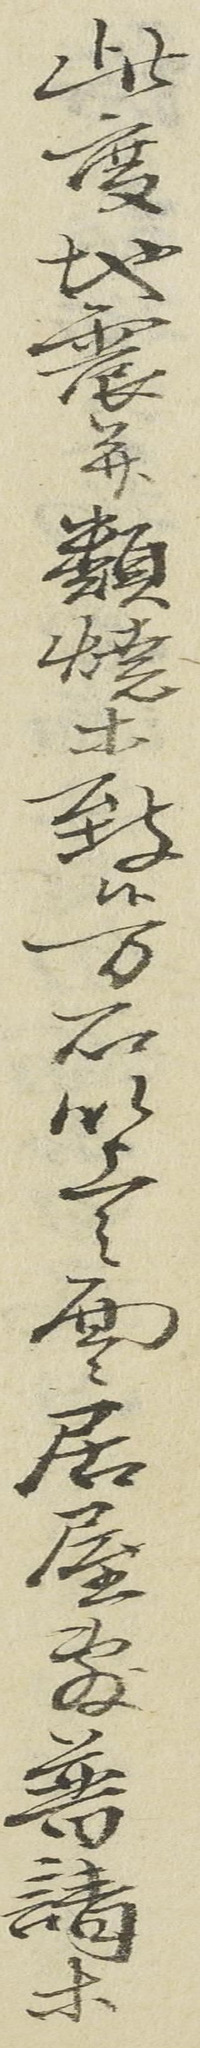此度地震幷類焼等致候万石以上之面々居屋敷普請等

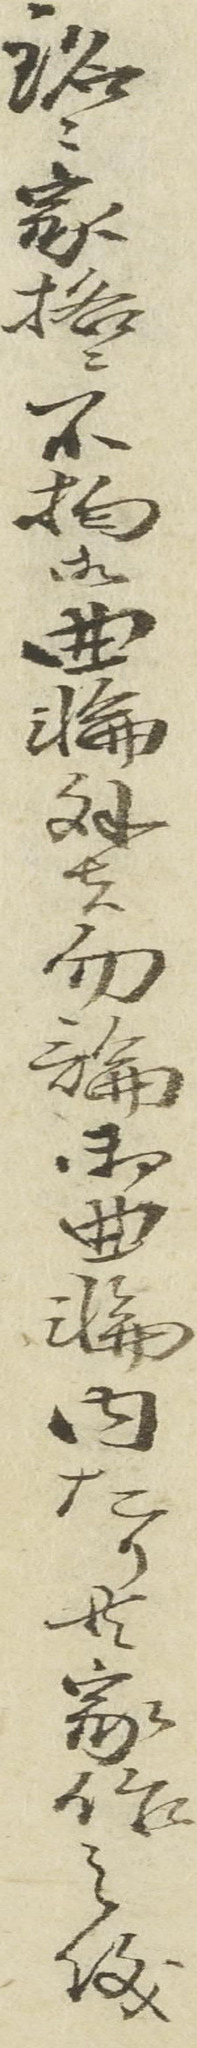銘々家格二不拘御曲輪外は勿論御曲輪内たり共家作之儀
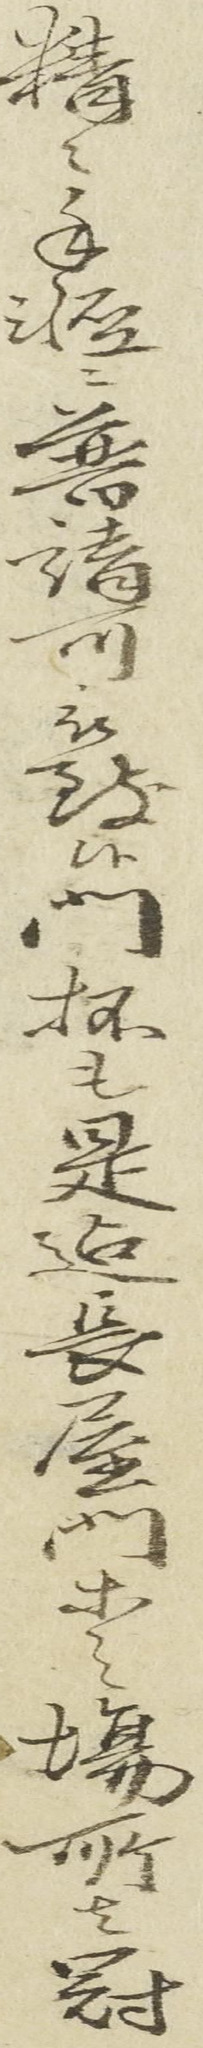精々手軽二普請可被致候門抔も是迄長屋門等の場所は冠
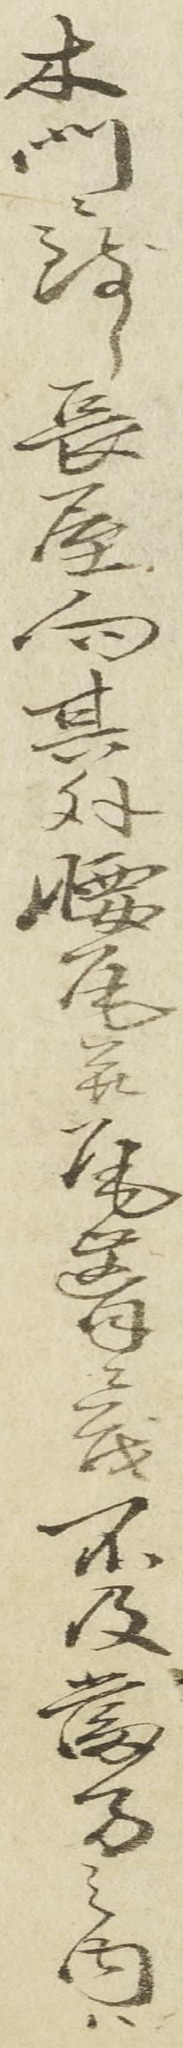木門二致し長屋向其外腰瓦幷瓦葺二茂不及当方之内ハ
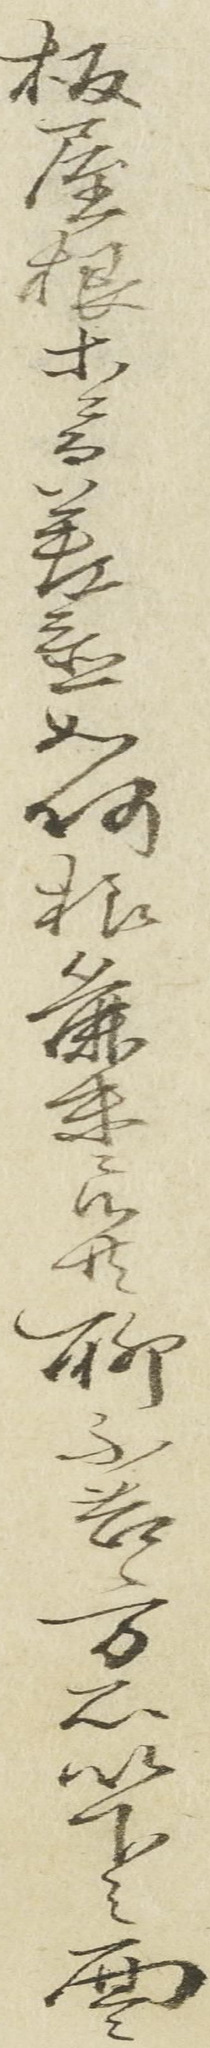板屋根等二而差置如何様麁末二候共聊不苦候万石以下之面々
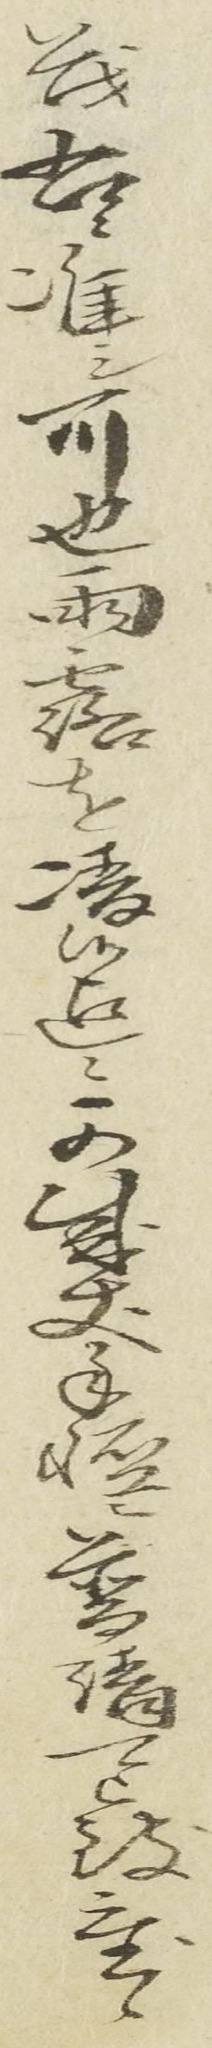茂右に准シ可也雨露を凌候迄二可成丈手軽二普請可被致置候
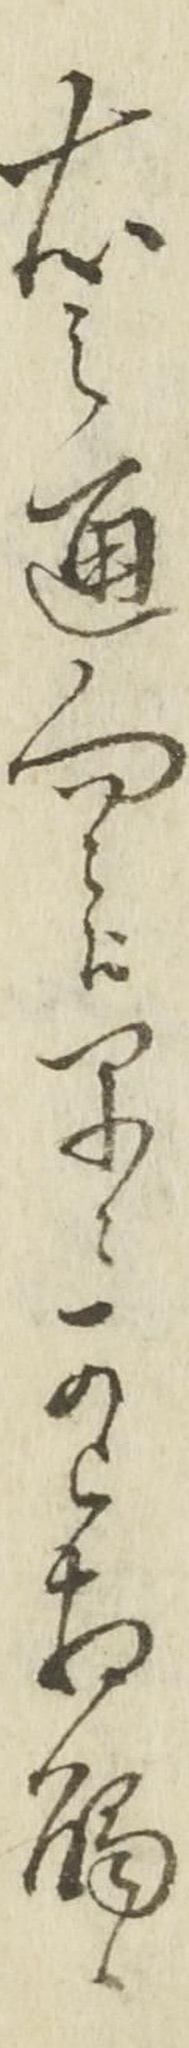右之通向々え早々可被相触候
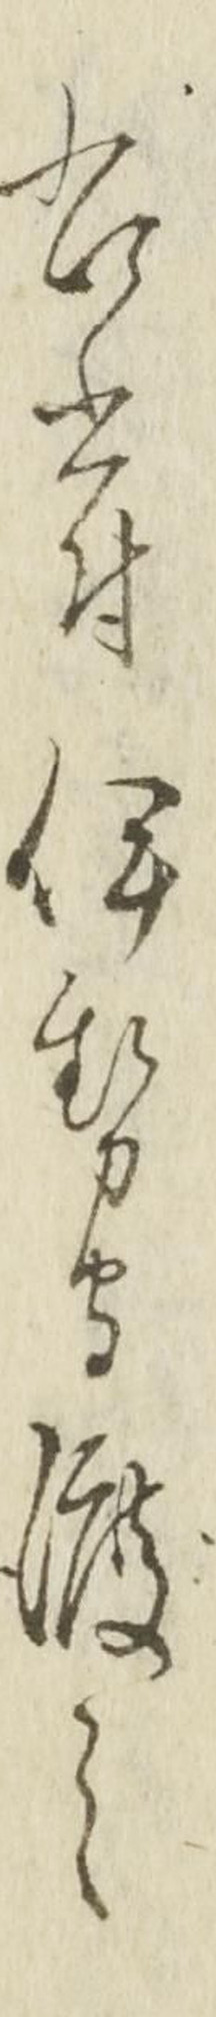右書付伊勢守渡之
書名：安政二乙卯年十月二日大地震之事
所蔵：東京大学地震研究所図書室 Earthquake Research Institute Library, The University of Tokyo, JAPAN
